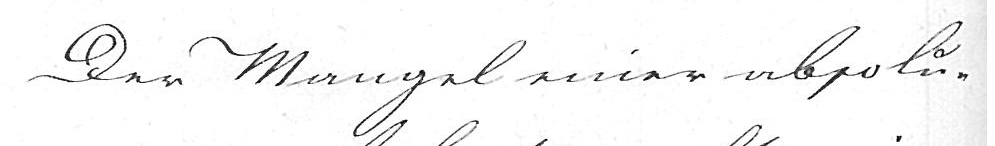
Der Mangel einer absolu-
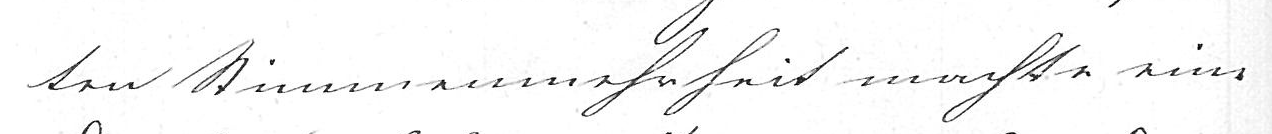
ten Stimmenmehrheit machte eine
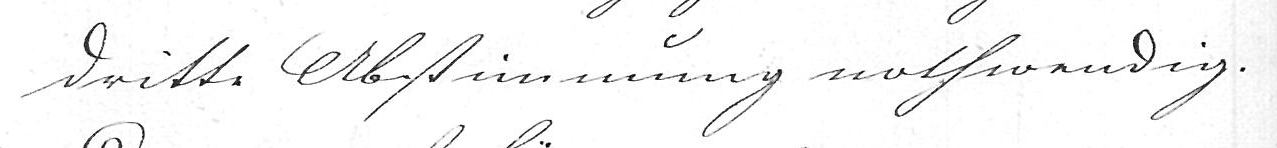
dritte Abstimmung nothwendig.
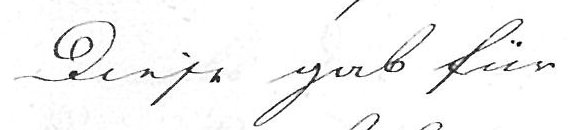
Diese gab für
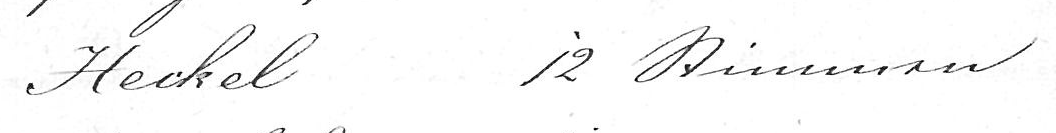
Heckel 12 Stimmen
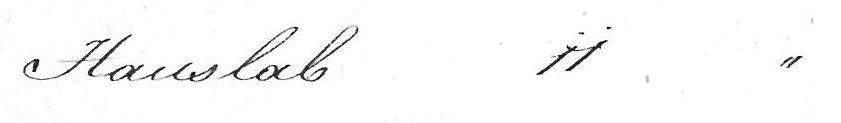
Hauslab 11 "
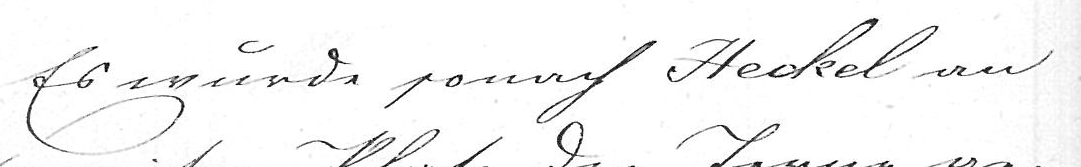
Es wunde sonach Heckel an
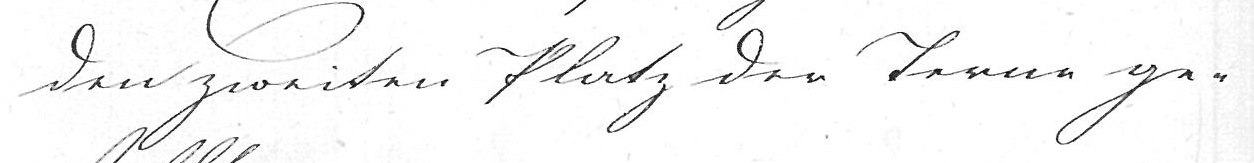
den zweiten Platz der Terne gen-
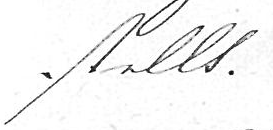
stellt.
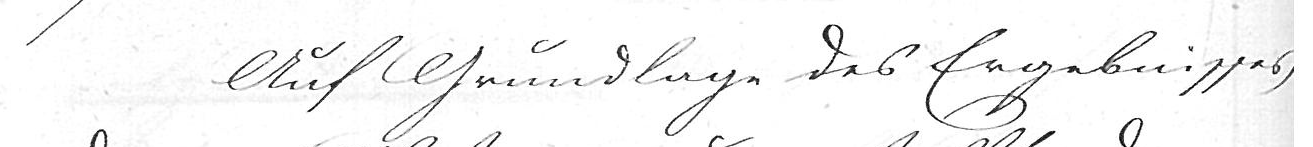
Auf Grundlage des Ergebnisses
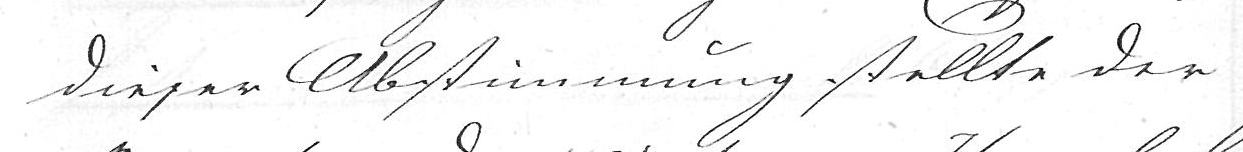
dieser Abstimmung stellte der
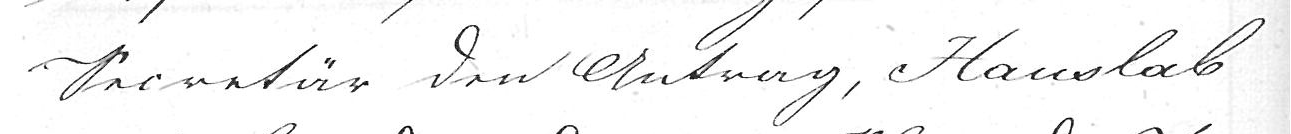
Secretär den Antrag, Hauslab
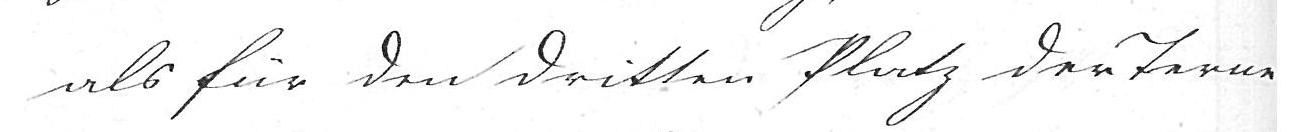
als für den dritten Platz der Terne
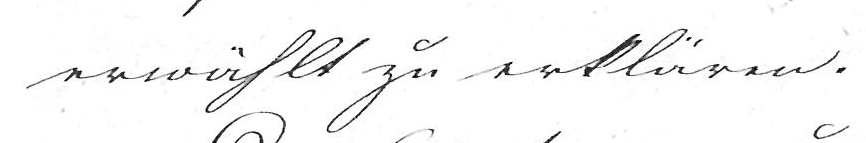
erwählt zu erklären.
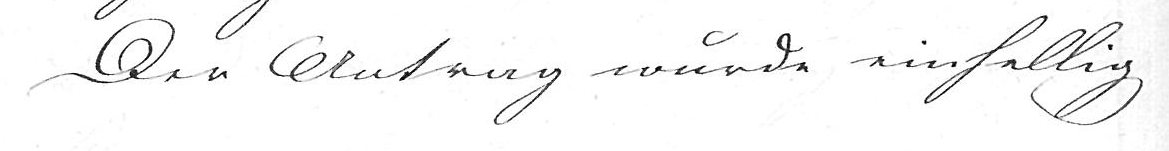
Der Antrag wurde einhellig
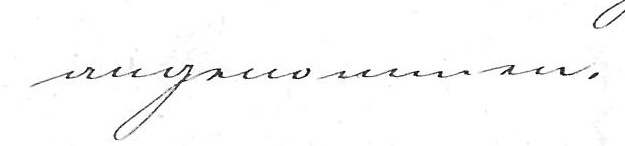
angenommen.
